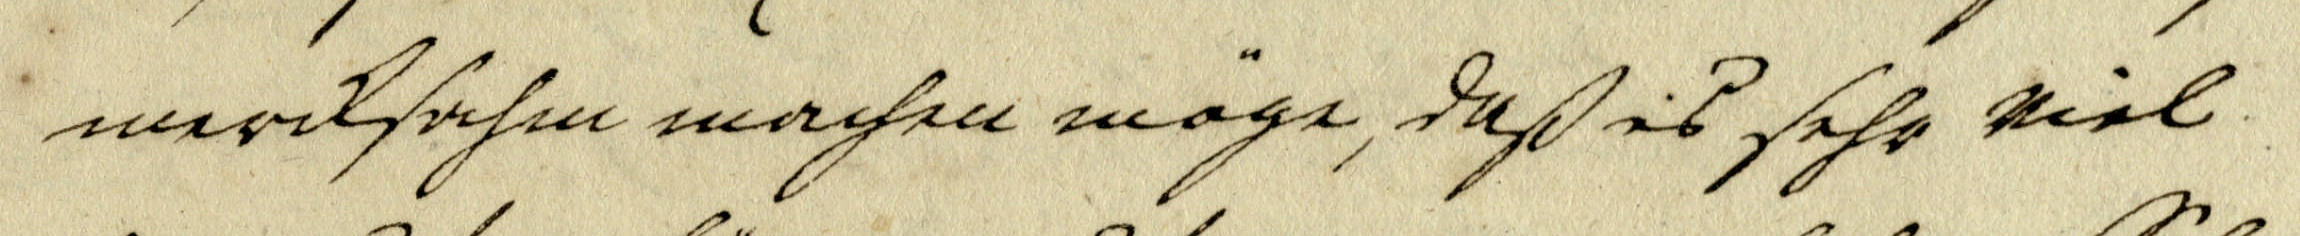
mercksahm machen möge, daß es sehr viel
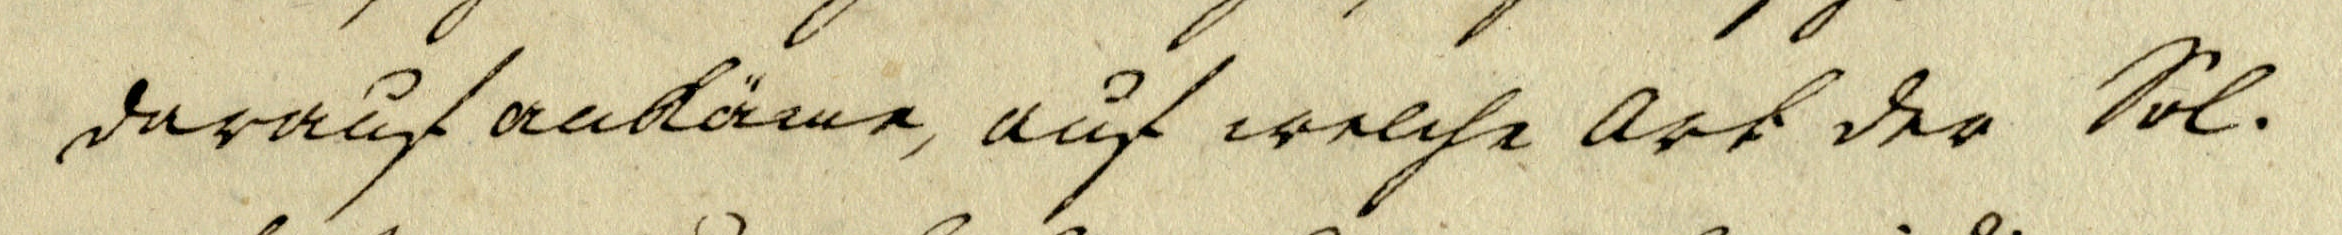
darauf ankäme, auf welche Art der Sol¬
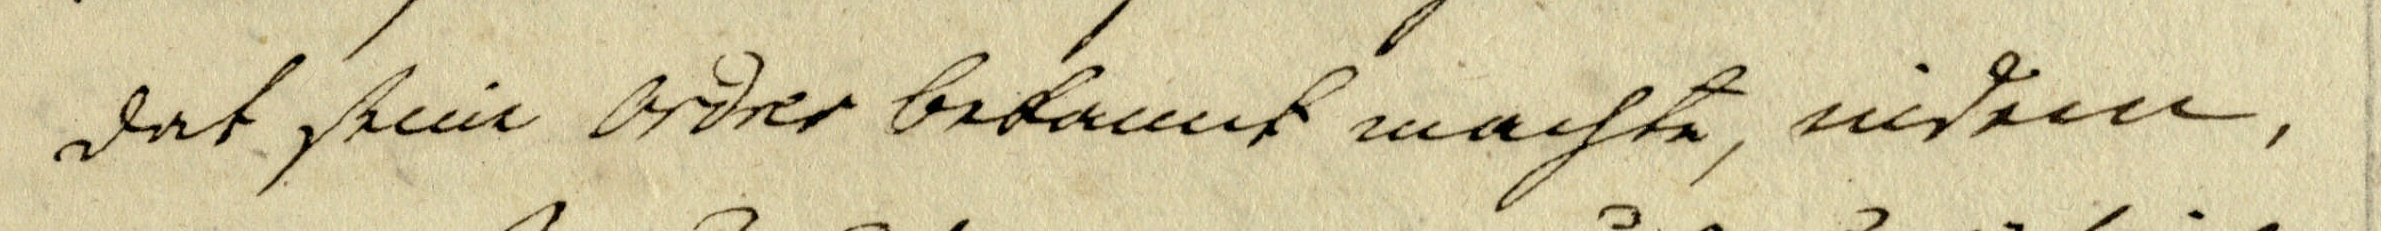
dat seine Ordres bekannt machte, indem,
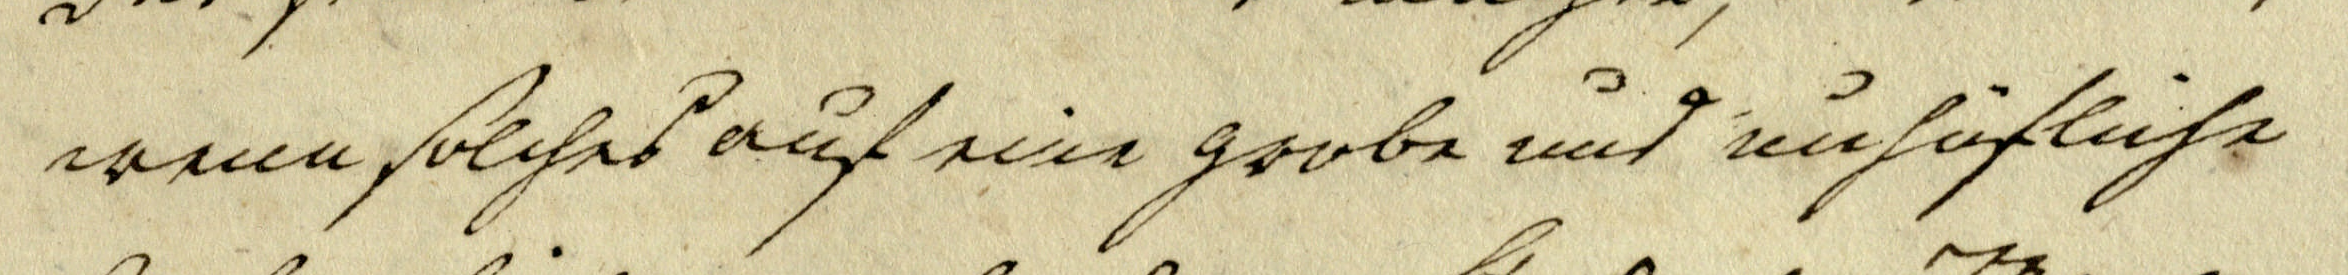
wenn solches auf eine grobe und unhöfliche
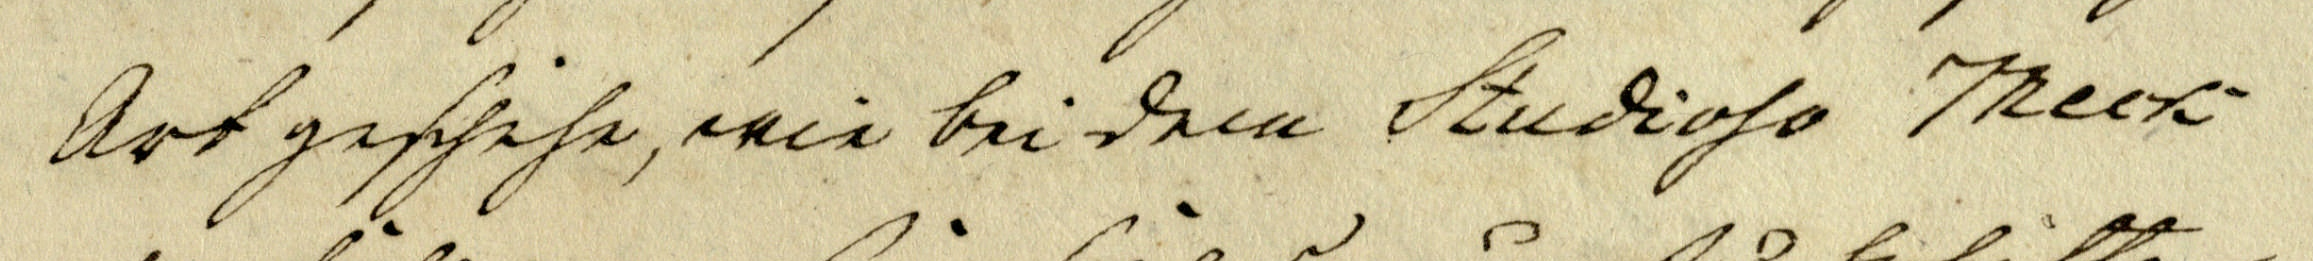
Art geschehe, wie bei dem Studioso Meck
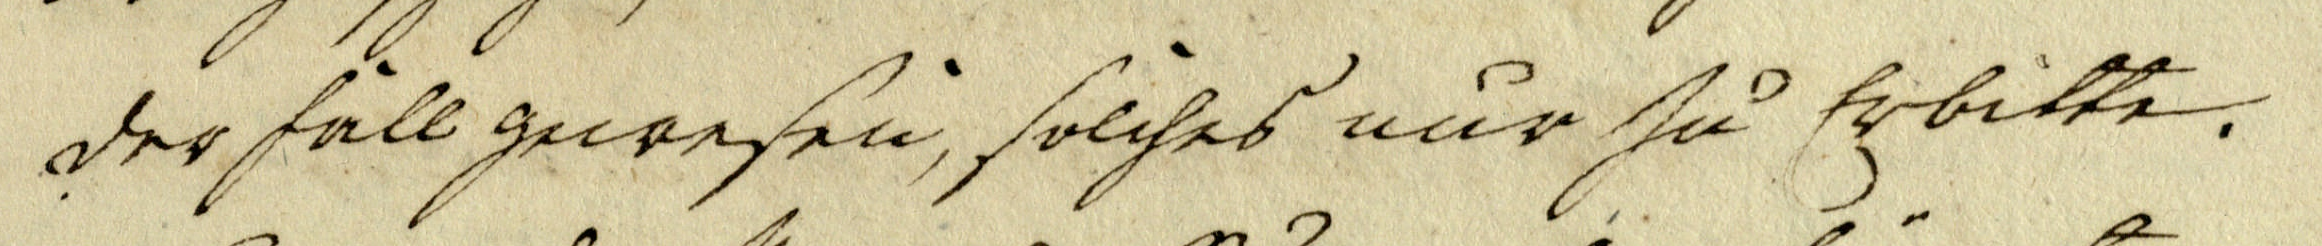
der Fall gewesen, solches nur zu Erbitte¬
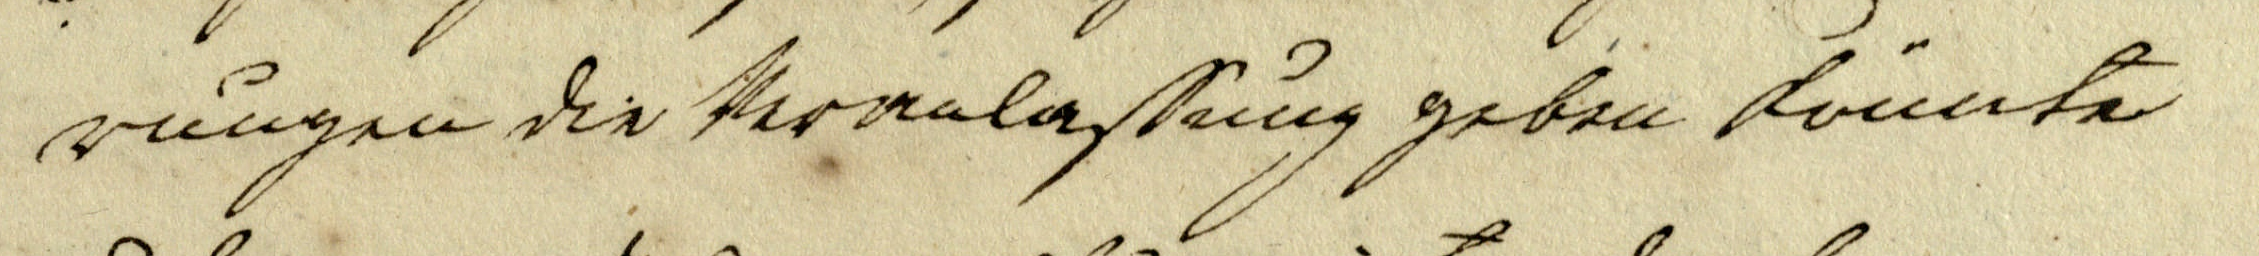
rungen die Veranlassung geben könnte
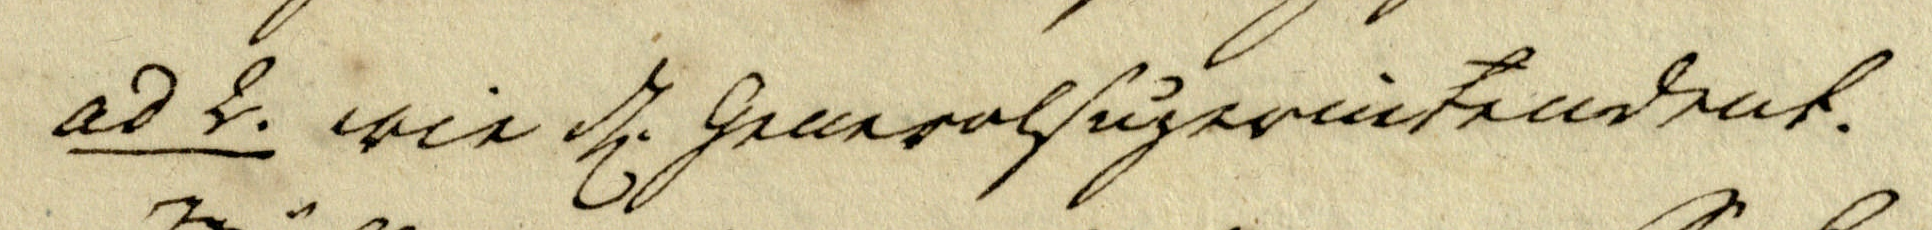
ad 2. wie dh. Generalsuperintendent.
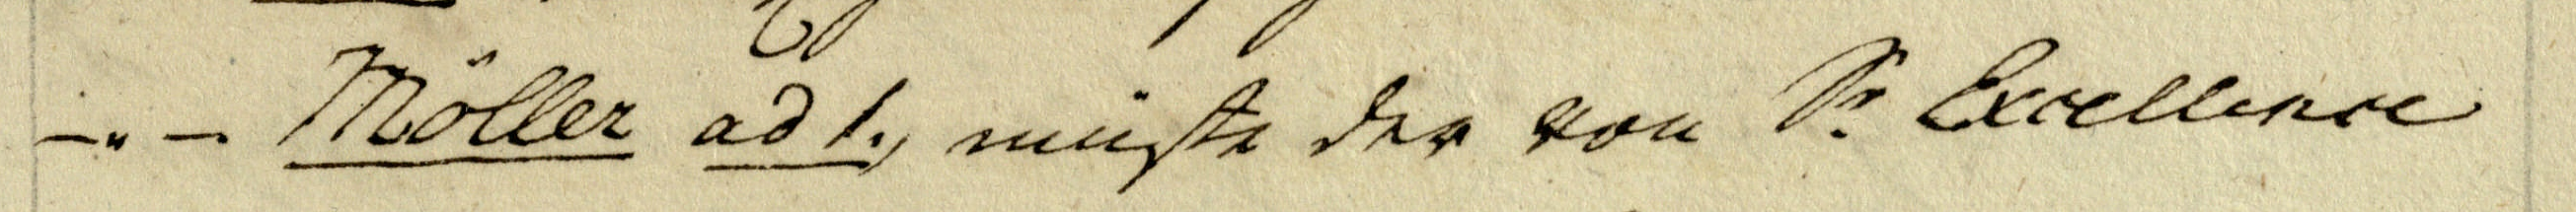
Möller ad 1. müsste der von Sr Excellence
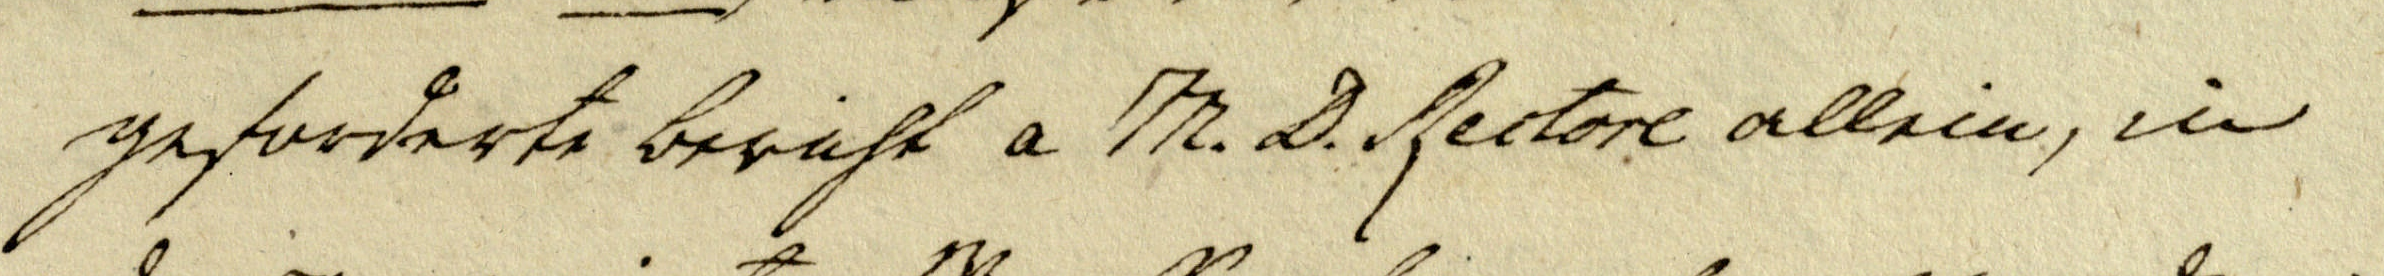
geforderte Bericht a M. D. Rectore allein, in
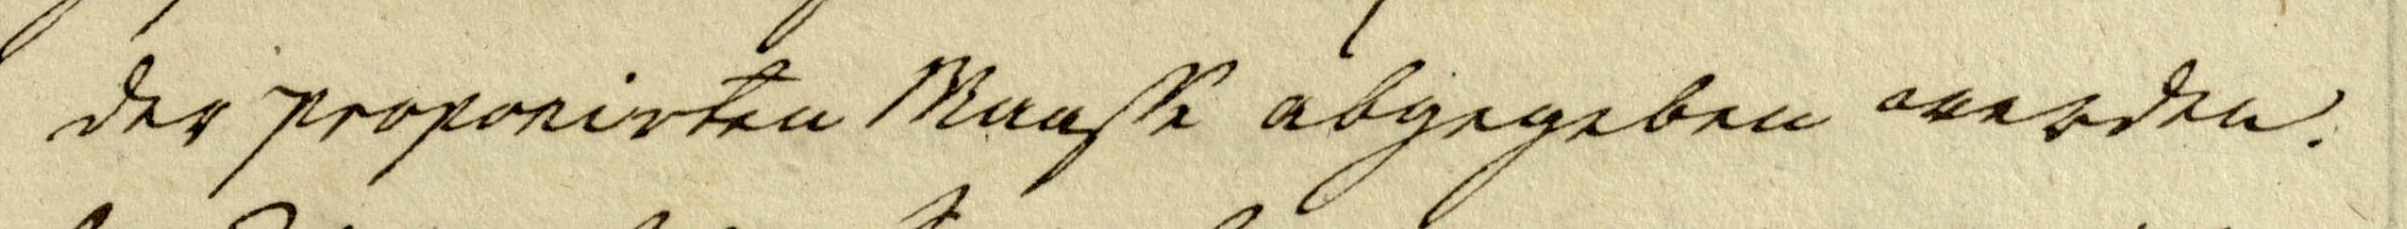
der proponirten Maasse abgegeben werden.
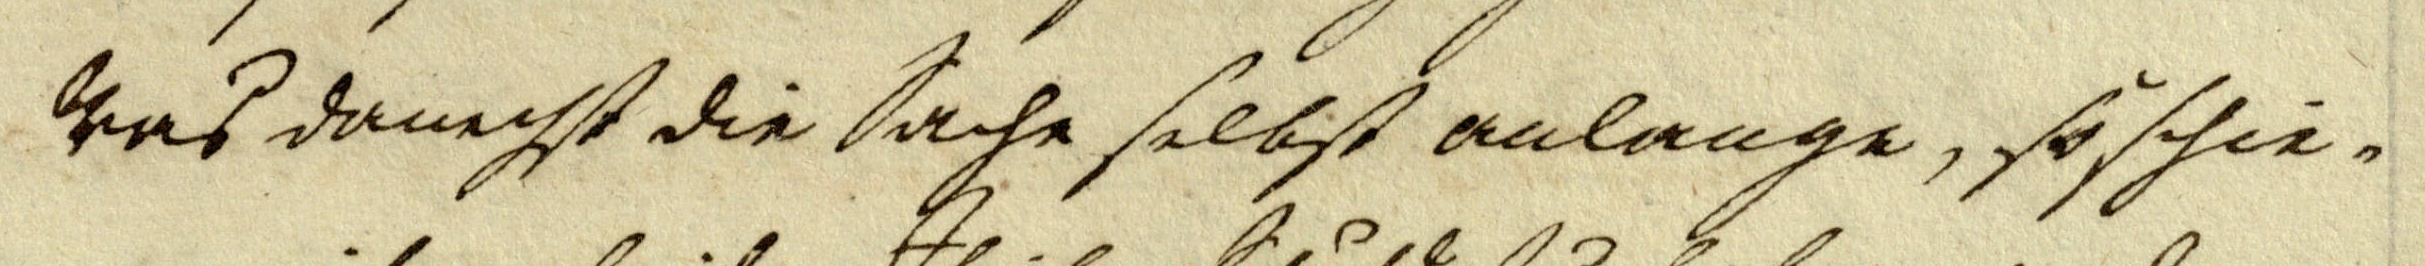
Was danechst die Sache selbst anlange, so schie¬
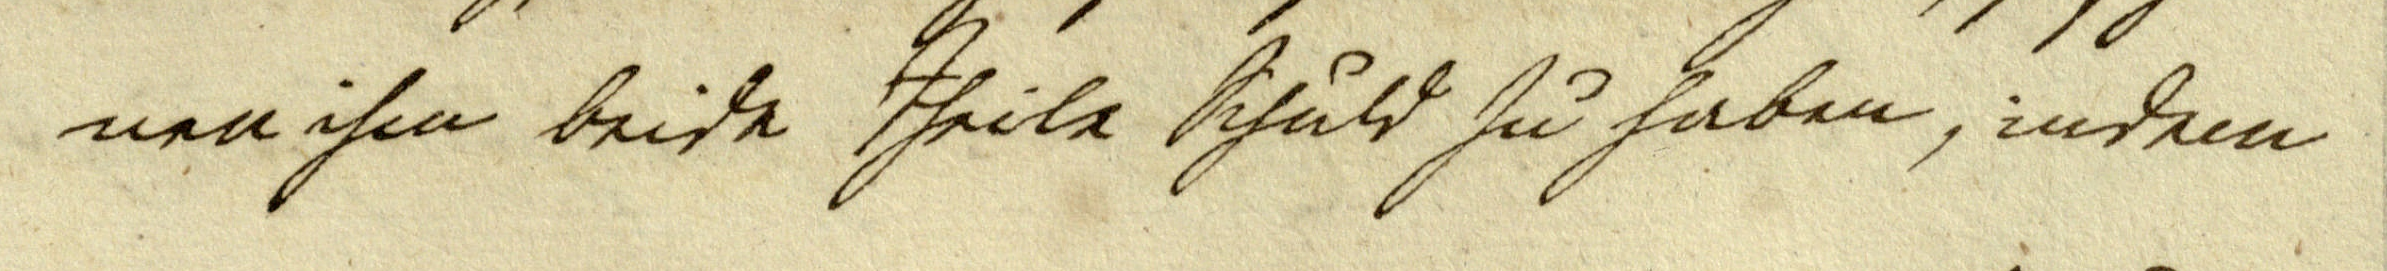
nen ihm beide Theile Schuld zu haben, indem
